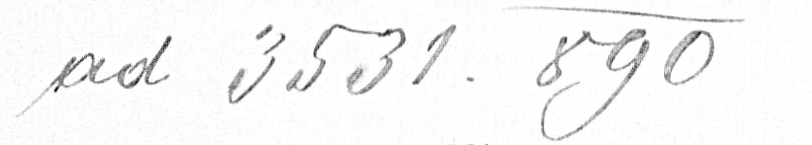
ad 3531. 890
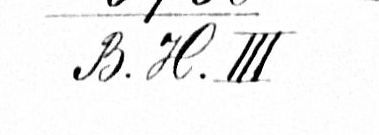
B.H.III
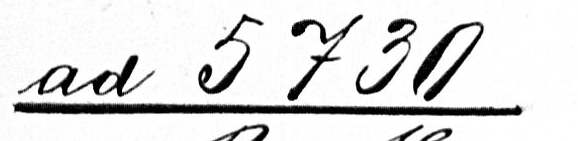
a 5730/
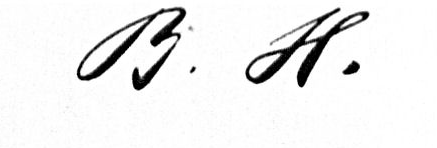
B. H.
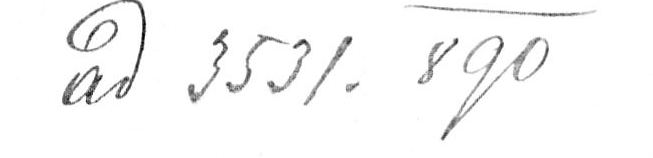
ad 5351. 890
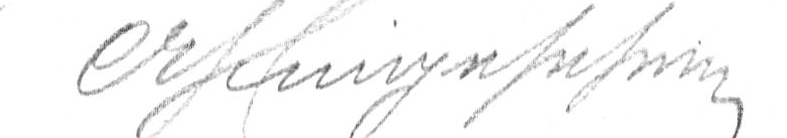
Ah Eingesehen
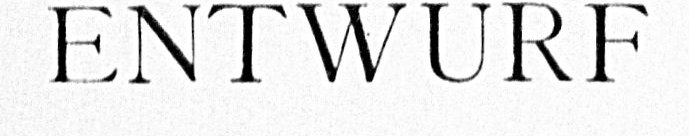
ENTWURF
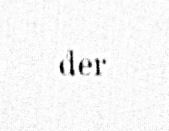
der
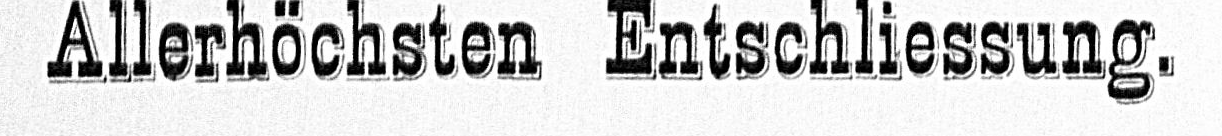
Allerhöchsten Entschliessung.
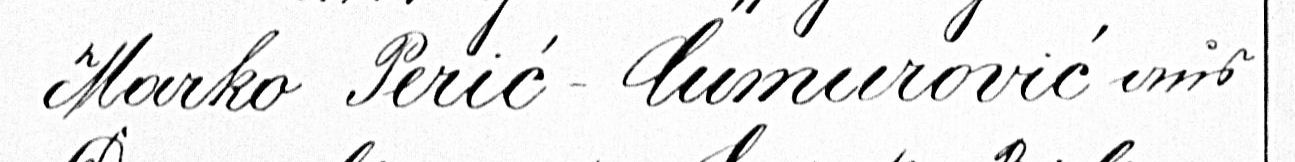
Marko Perić - Cumurović aus
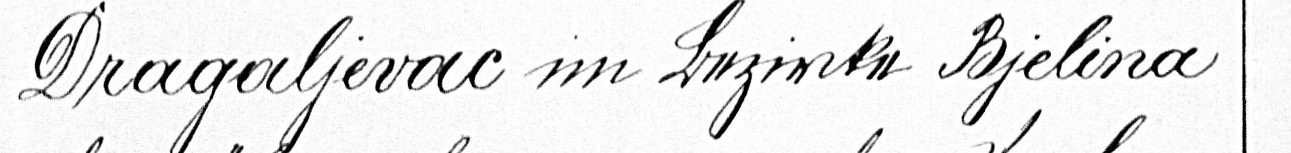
Dragaljevac im Bezirke Bjelina
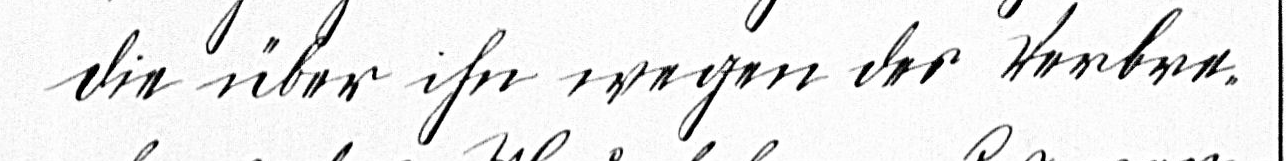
die über ihn wegen der Verbre¬
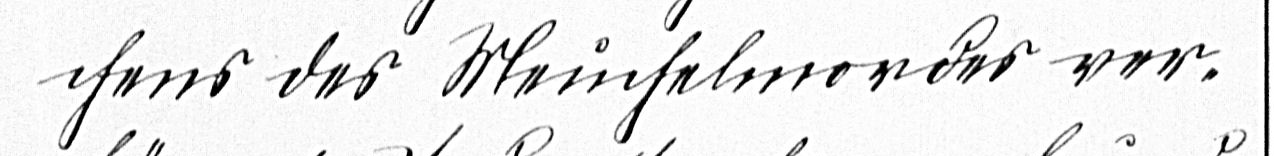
chens des Meuchelmordes ver¬
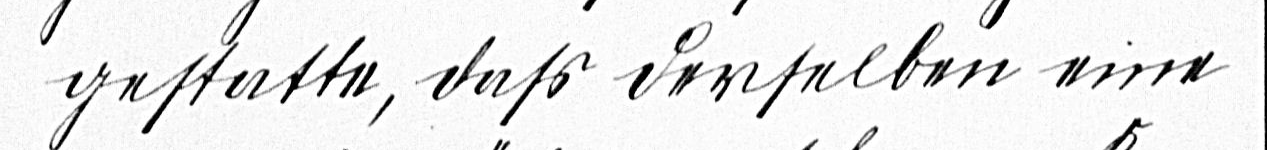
gestatte, dass derselben eine
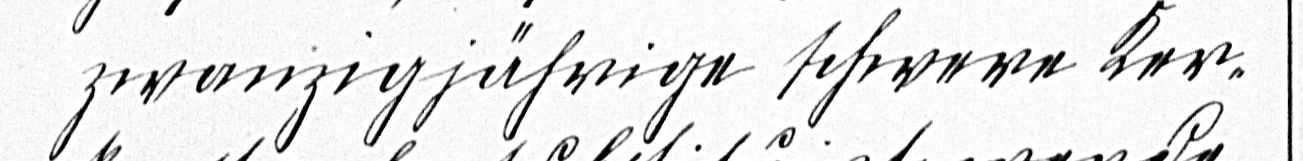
zwanzigjährige schwere Ker¬
